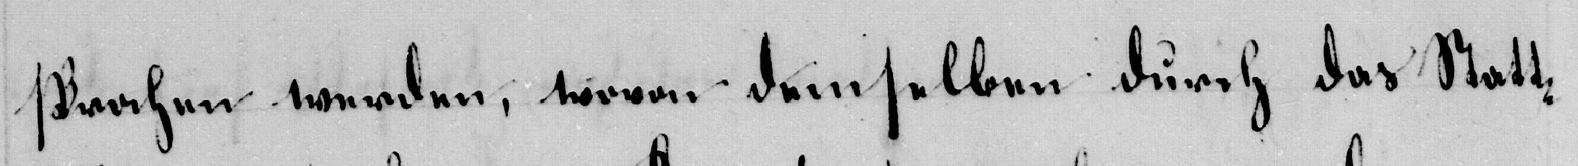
sprochen werden, wovon demselben durch das Statt¬
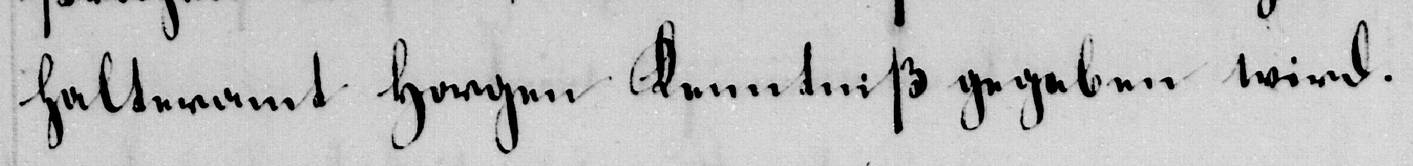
halteramt Horgen Kenntniß gegeben wird.
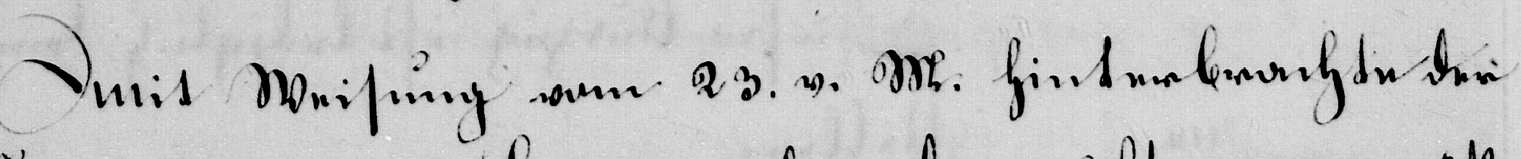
Mit Weisung vom 23. v. M. hinterbrachte der
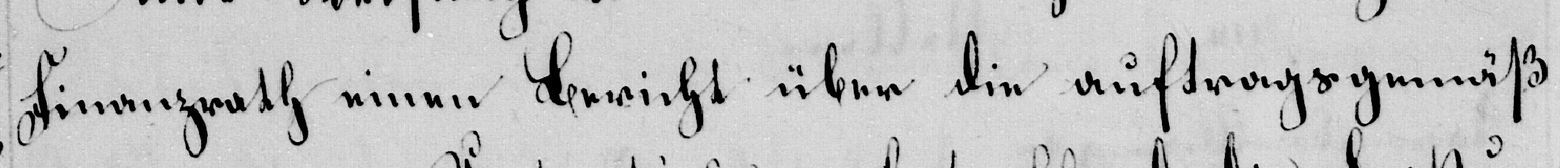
Finanzrath einen Bericht über die auftragsgemäß
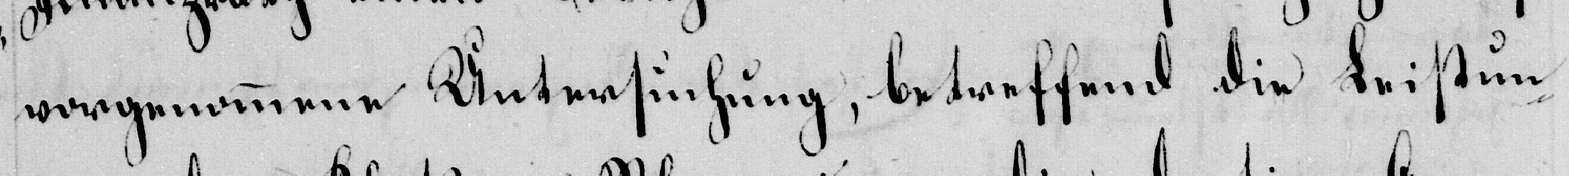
vorgenommene Unterstützung, betreffend die Leistun¬
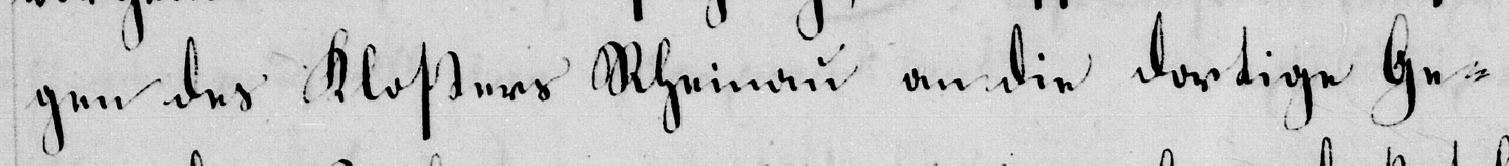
gen des Klosters Rheinau an die dortige Ge¬
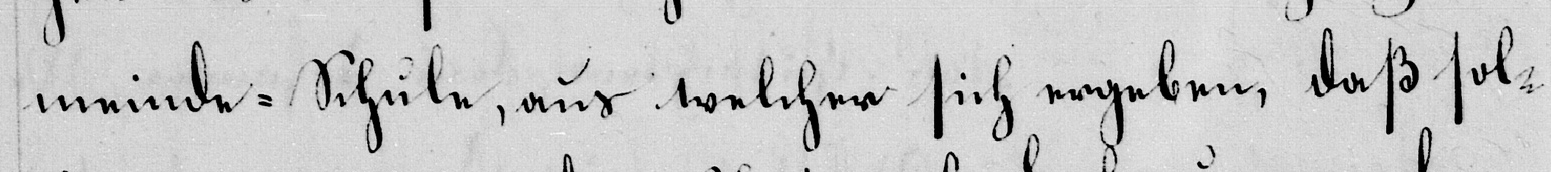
meinde-Schule, aus welcher sich ergeben, daß sol¬
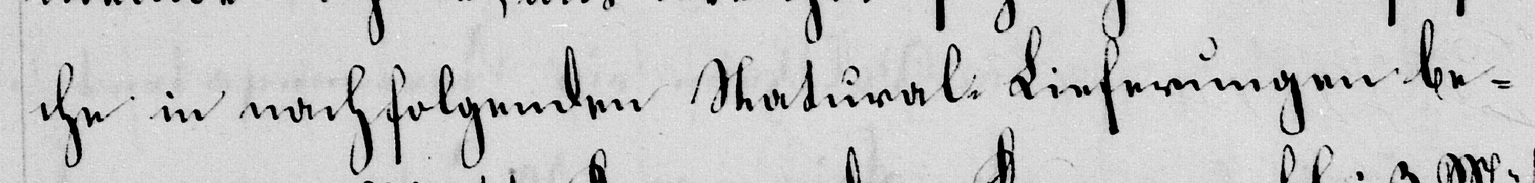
che in nachfolgenden Natural-Lieferungen be¬
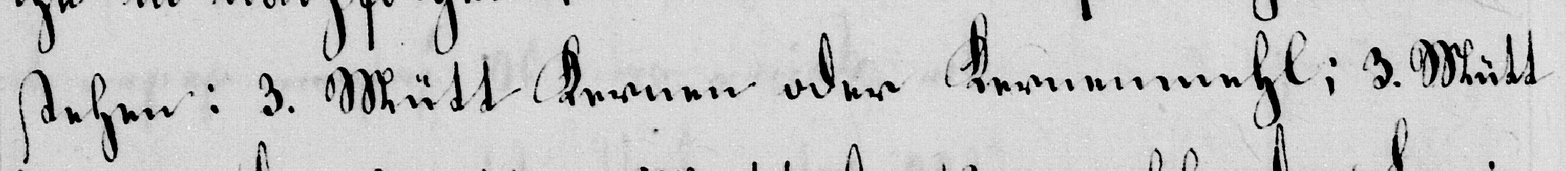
stehen: 3. Mütt Kernen oder Kernenmehl; 3. Mütt
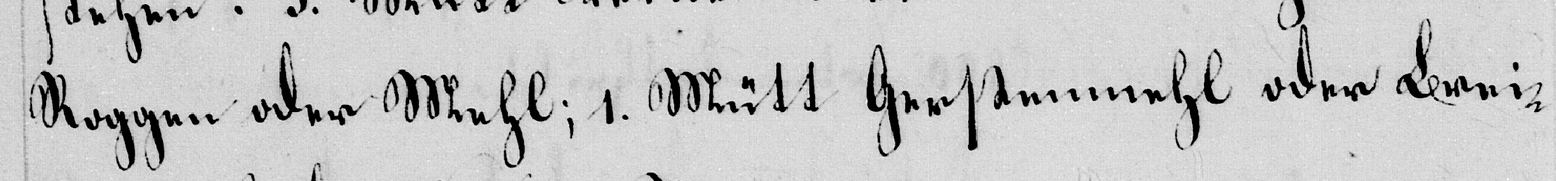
Roggen oder Mehl; 1. Mütt Gerstenmehl oder Brei¬
